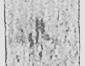十
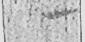一
